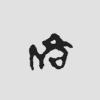咎
